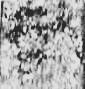司
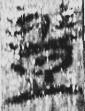豐
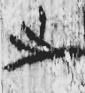之
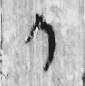人
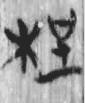桯
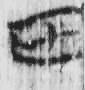甲
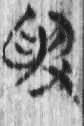受
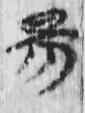昜
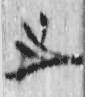之
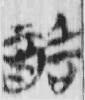官
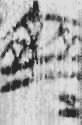齊齊
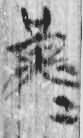黃
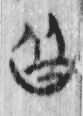皆
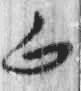㠯（以）
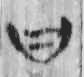甘
